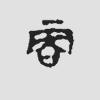丙
